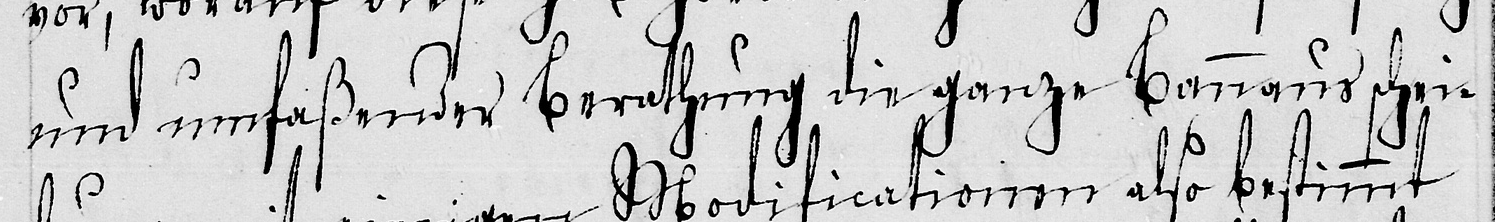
und umfaßender Berathung die ganze Bannausschei¬
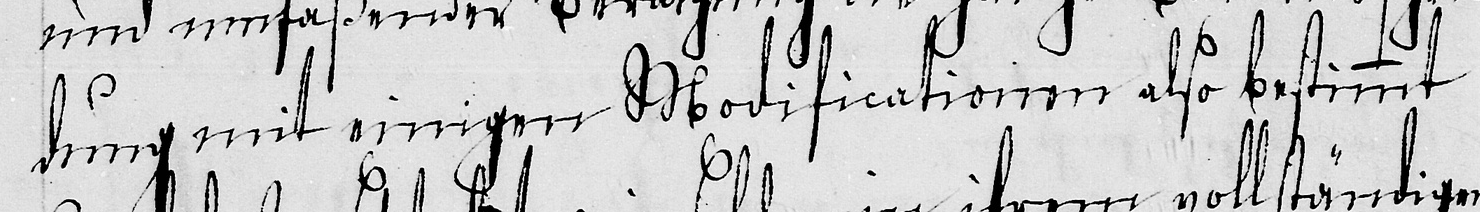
dung mit einigen Modificationen also bestimmt
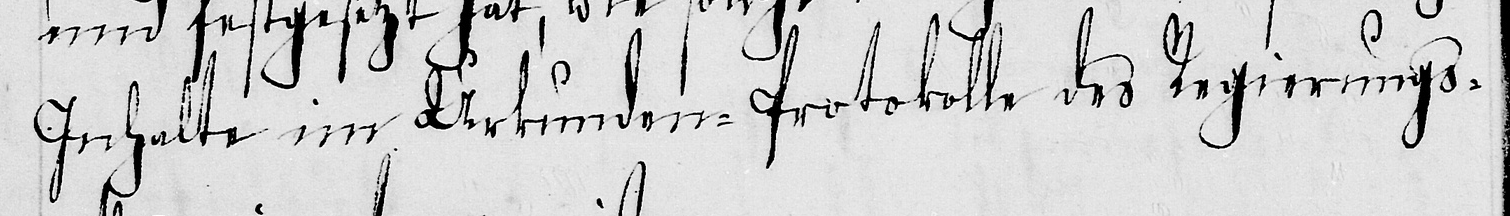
Inhalte im Urkunden-Protokolle des Regierungs¬
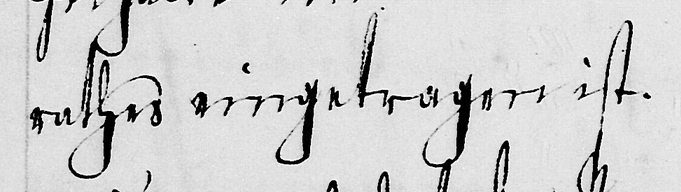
rathes eingetragen ist.
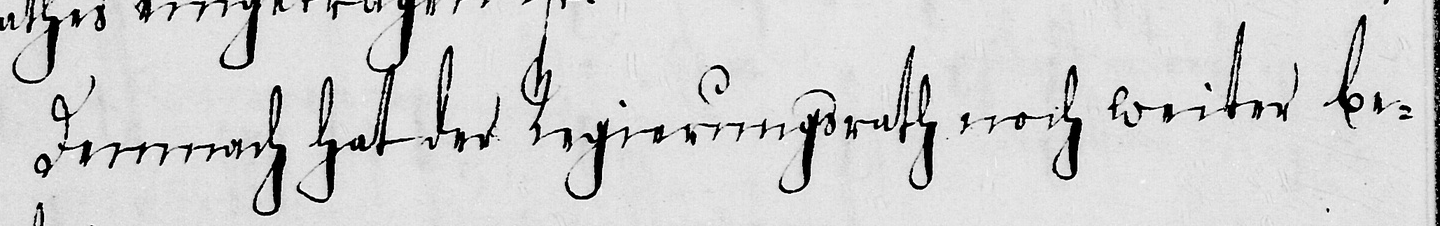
Demnach hat der Regierungsrath noch weiter be¬
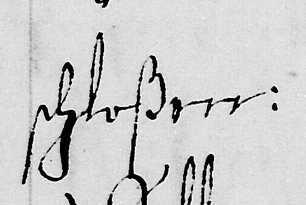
schloßen:
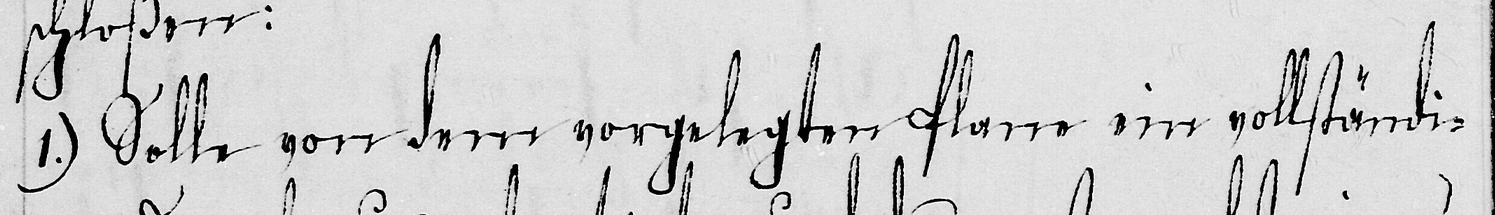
1.) Solle von dem vorgelegten Plane ein vollständi¬
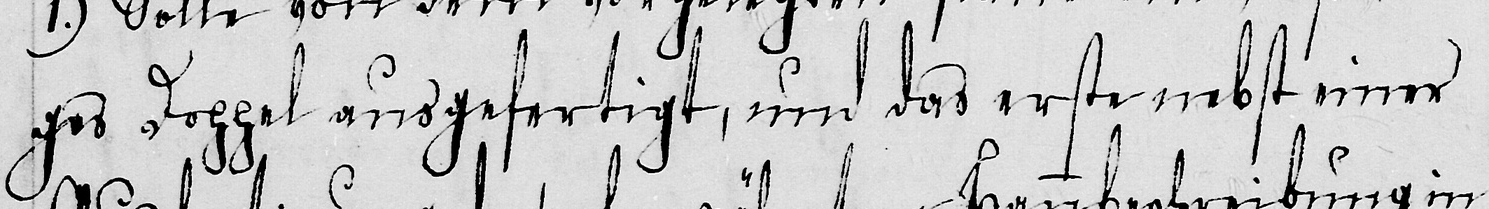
ges Doppel ausgefertigt, und das erste nebst einer
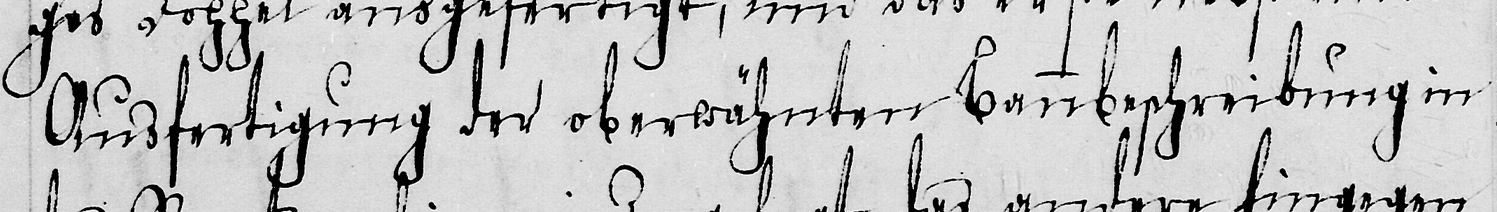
Ausfertigung der oberwähnten Bannbeschreibung in
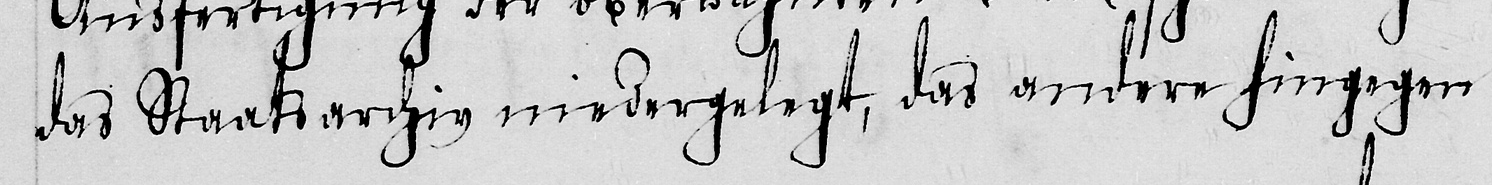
das Staatsarchiv niedergelegt, das andere hingegen
